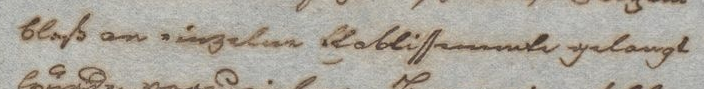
bloß an einzelne Etablissemente gelangt
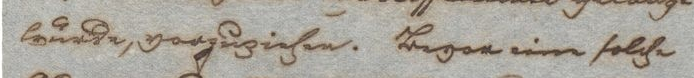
würde, vorzuziehen. Bevor eine solche
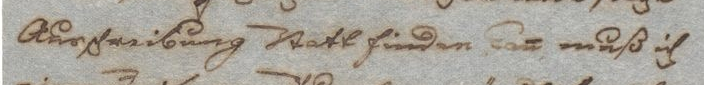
Ausschreibung Statt finden kann, muß ich
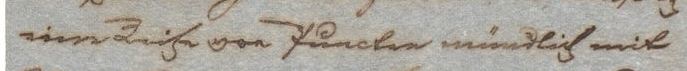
eine Reihe von Puncten mündlich mit
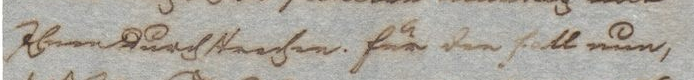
Ihnen durchsprechen. Für den Fall nun,
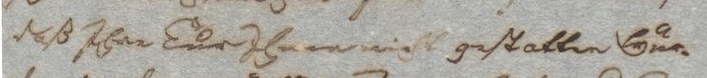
daß Ihre Cur nicht gestatten wür-
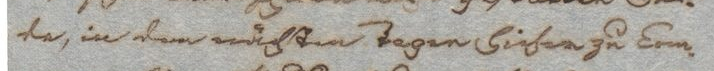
de, in den nächsten Tagen hieher zu kom-
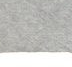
mei-
